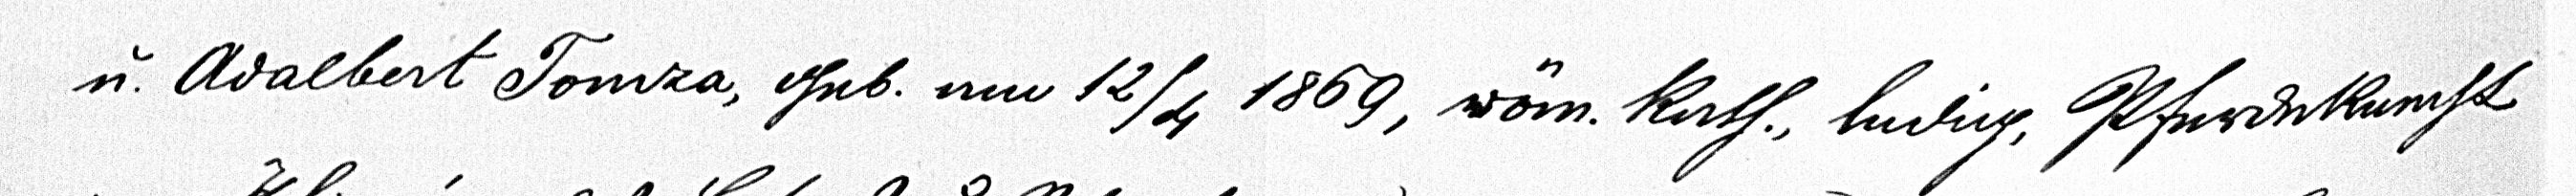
u. Adalbert Tomza, geb. am 12/4 1869, röm. kath., ledig, Pferdekamst
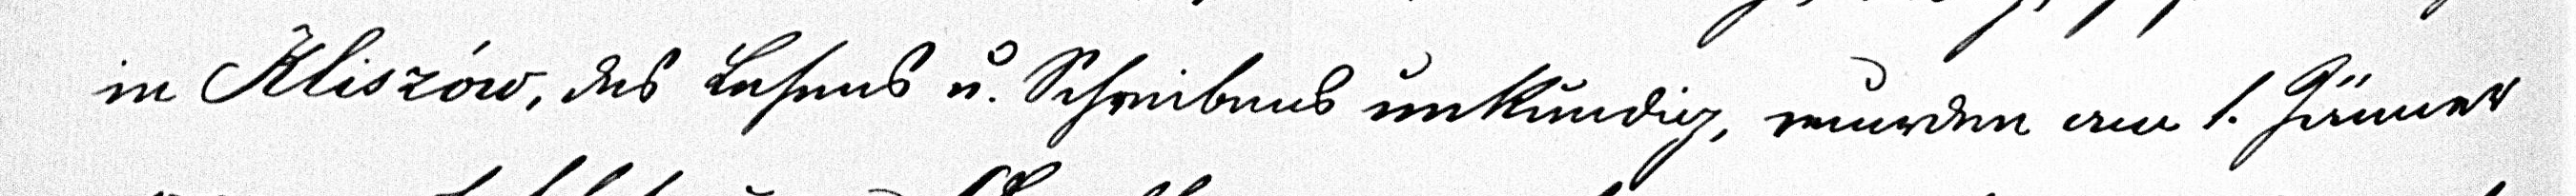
in Kliszów, des Lesens u. Schreibens unkundig, wurden am 1. Jänner
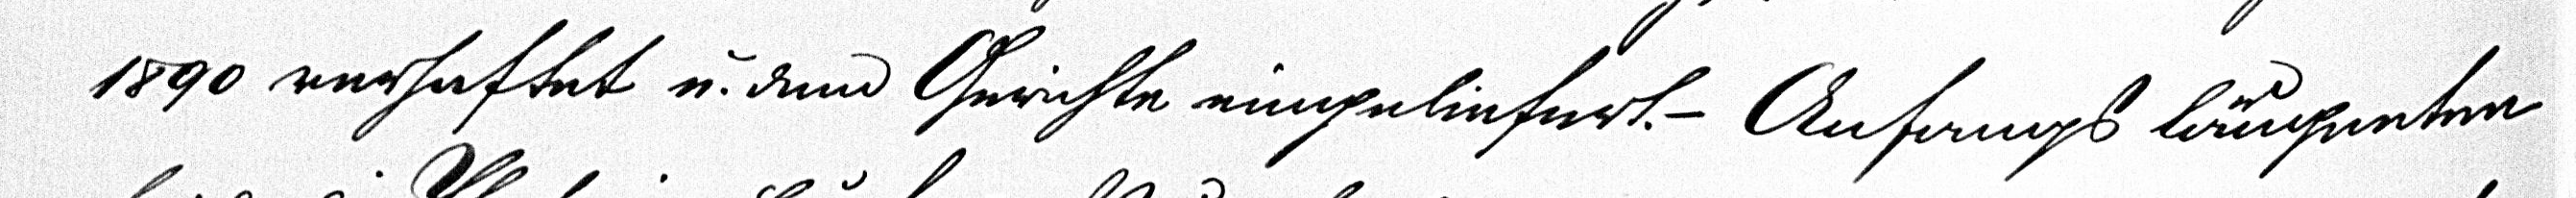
1890 verhaftet u. dem Gerichte eingeliefert.- Anfangs läugenten
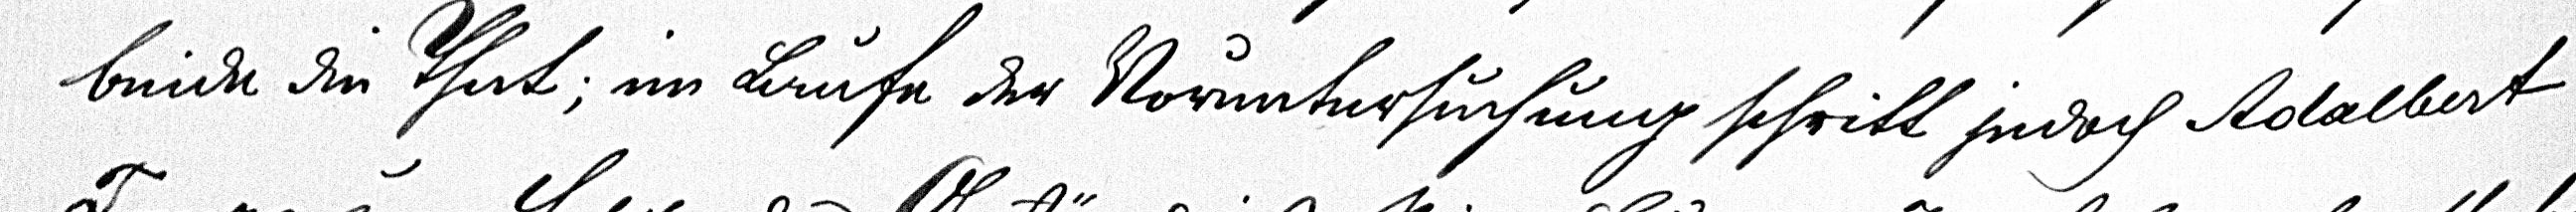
beide die That; im Laufe der Voruntersuchung schritt jedoch Adalbert
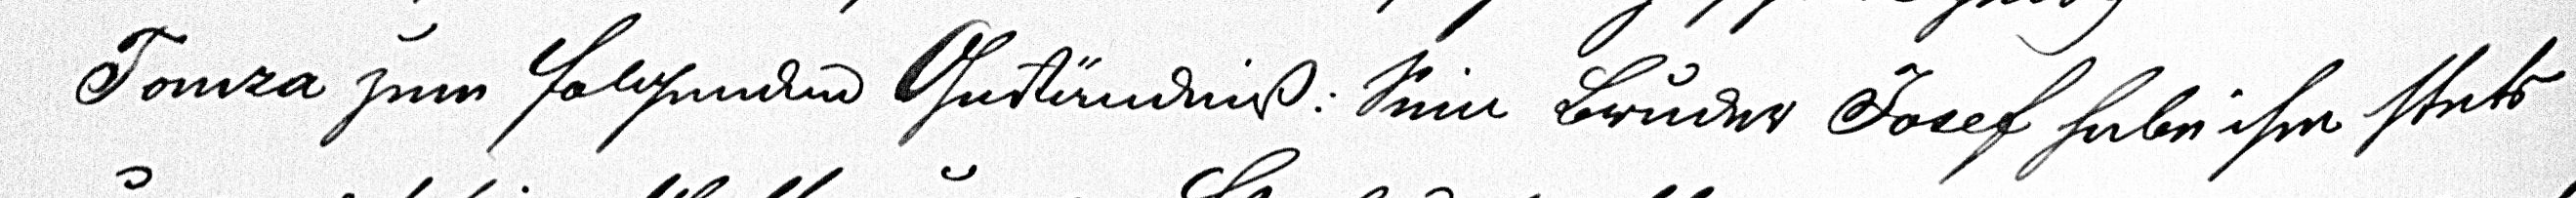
Tomza zum folgenden Geständniß: Sein Bruder Josef habe ihm stets
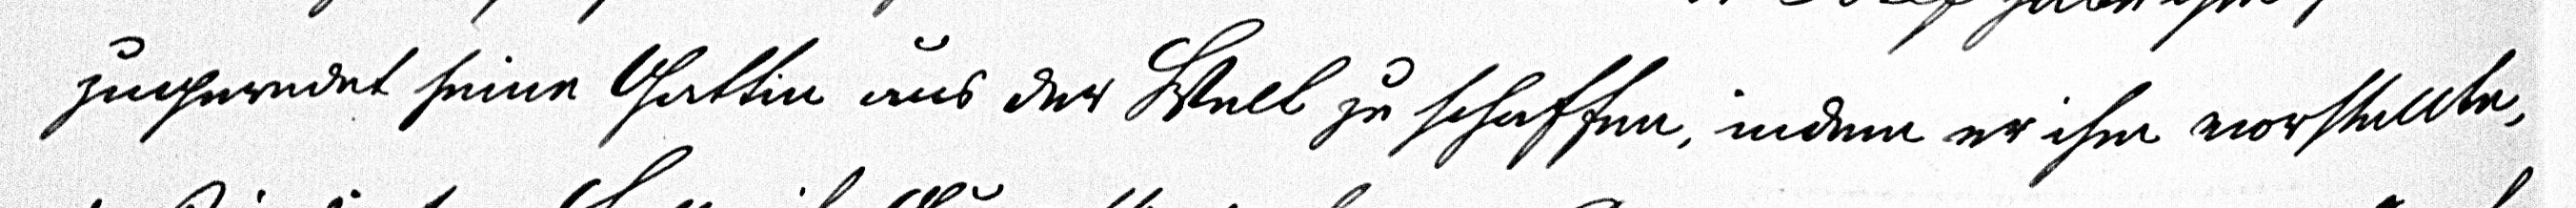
zugeredet seine Gattin aus der Well zu schaffen, indem er ihm vorstellte,
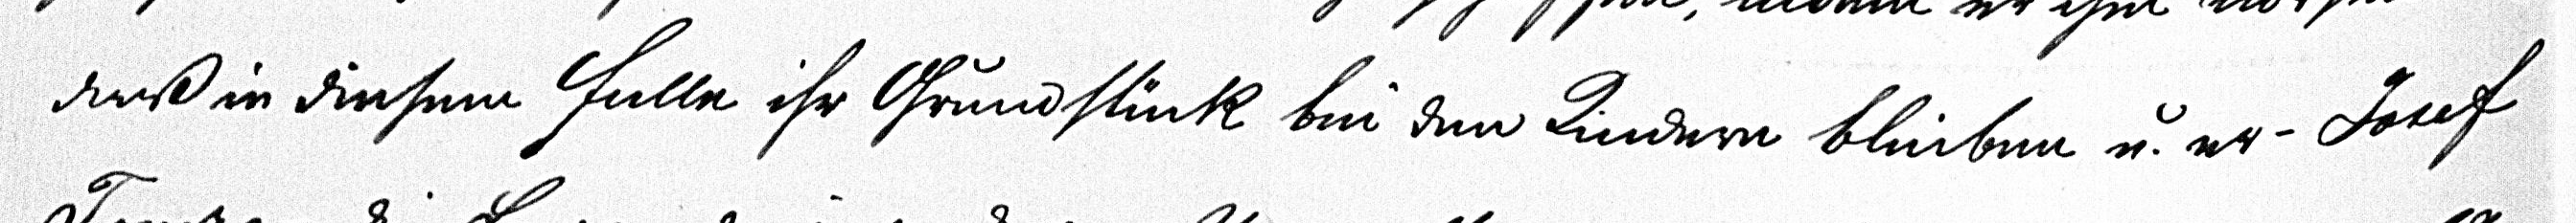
daß in diesem Felle ihr Grundstück bei den Kindern bleiben u. er- Josef
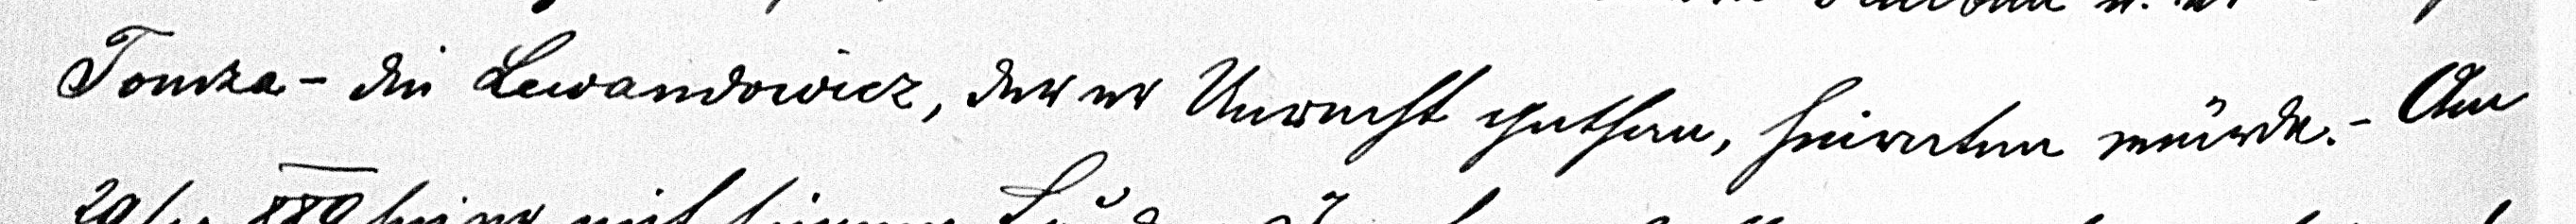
Tomza - die Lewandowicz, der er Unrecht gethan, heiraten wurde.- Am
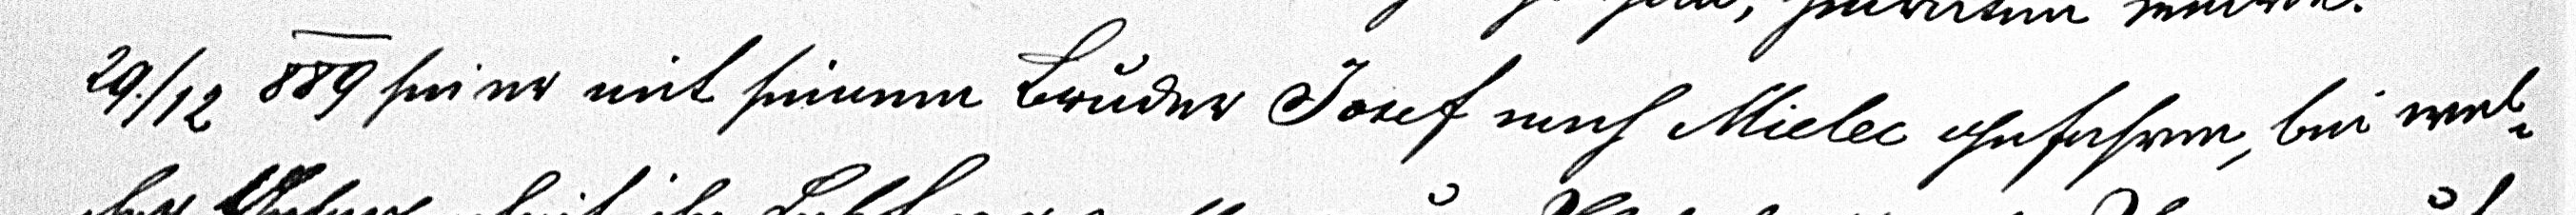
29./12 889 sei er mit seinem Bruder Josef nach Mielec gefahren, bei wel¬
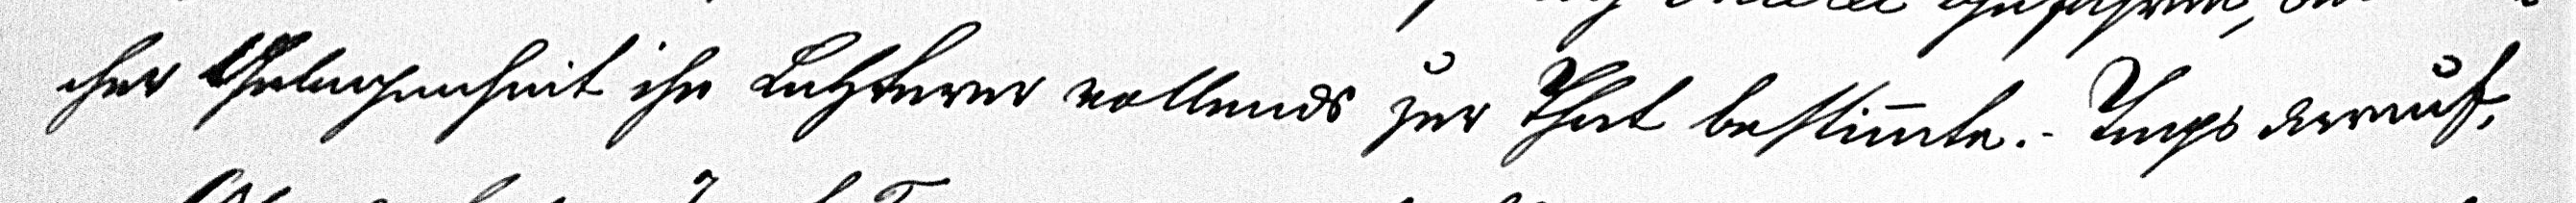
cher Gelegenheit ihn Letzterer vollends zur That bestimmte.- Tags darauf,
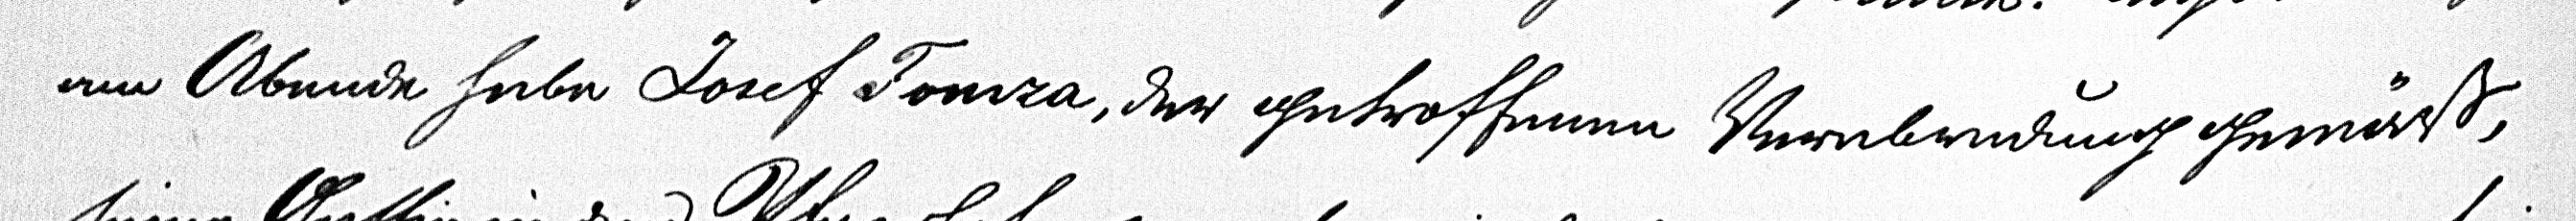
am Abende habe Josef Tomza, der getroffenen Verabredung gemäß,
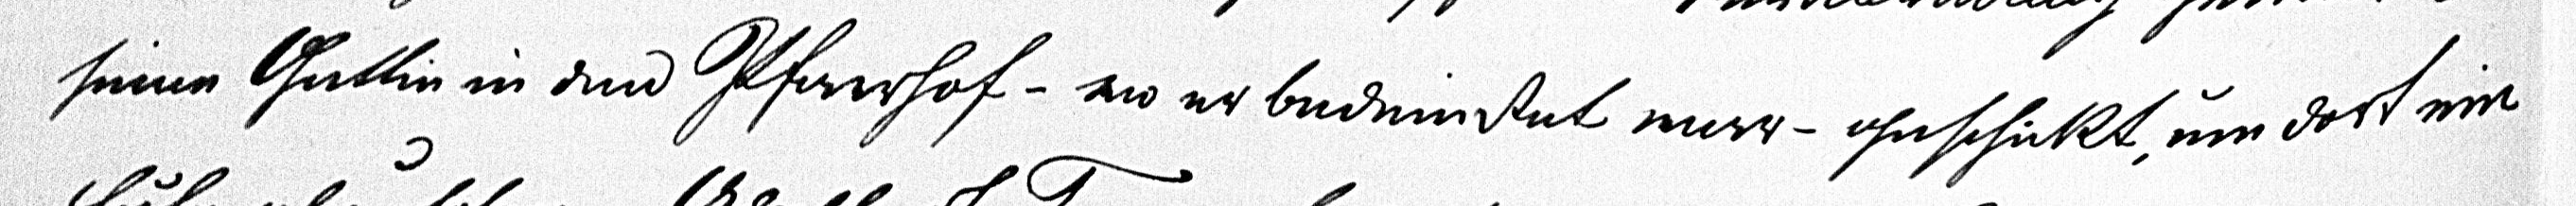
seine Gattin in den Pfarrhof - wo er bedienstet war - geschickt, um dort ein
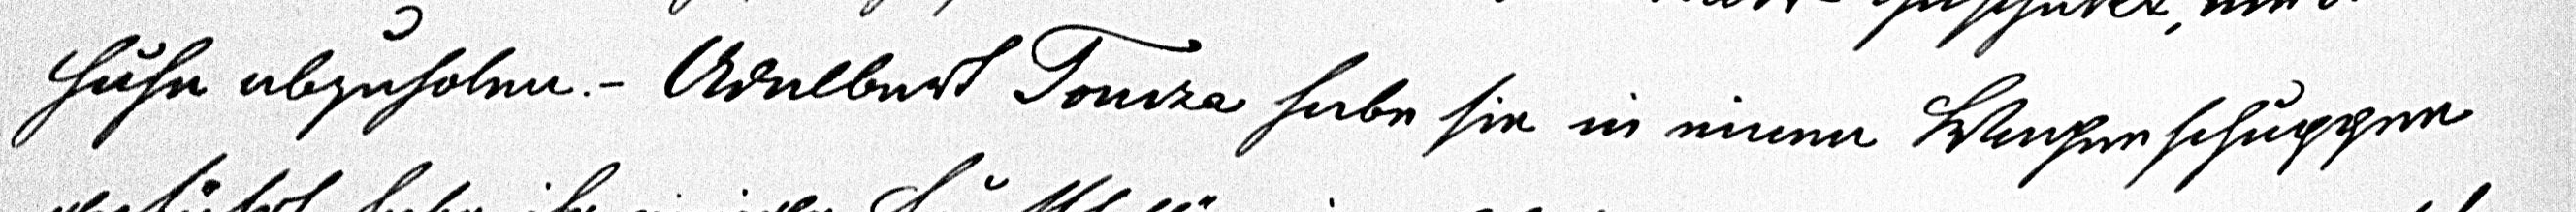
Huhn abzuholen.- Adalbert Tomza habe sie in einen Wegen schuppen
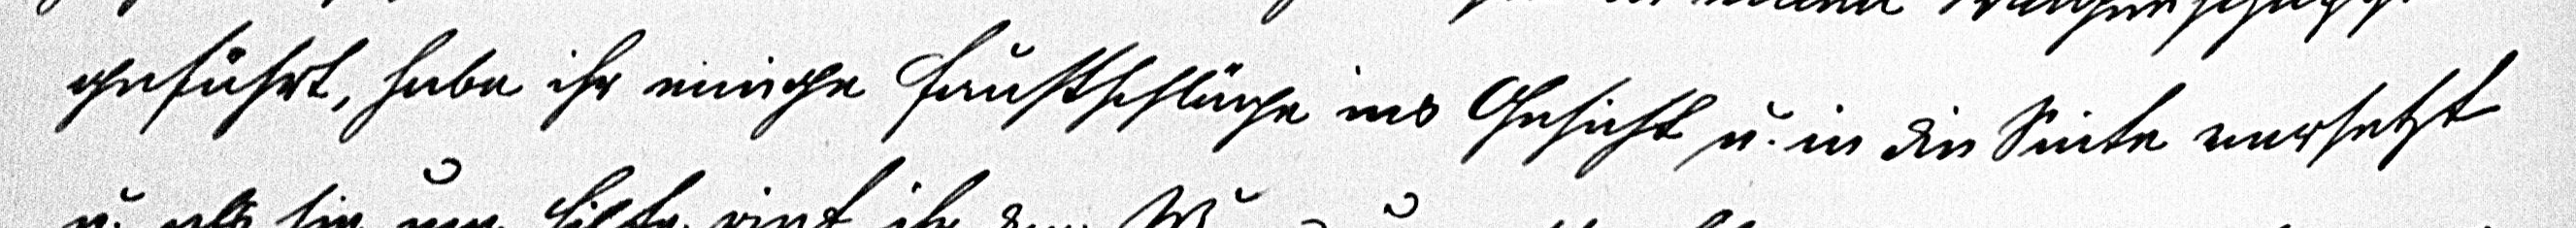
geführt, habe ihr einige faustschlüge ins Gesicht u. in die Seite versetzt
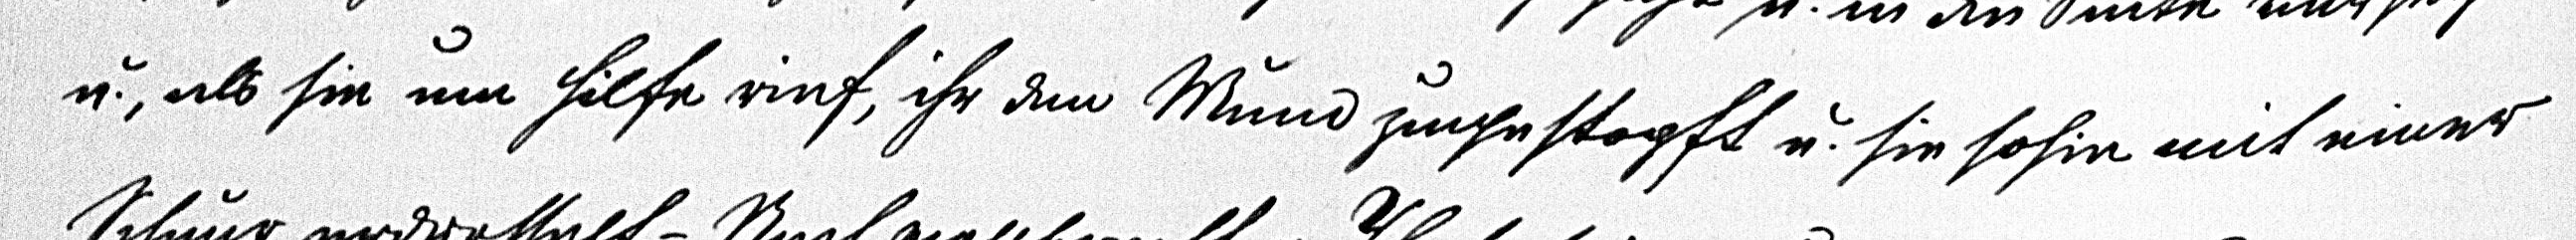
u., als sie um Hilfe rief, ihr den Mund zugestopft u. sie sohin mit einer
